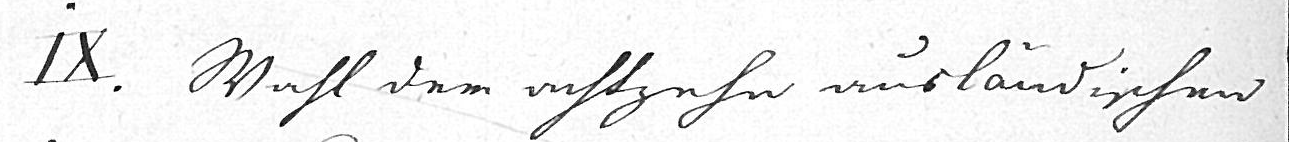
IX. Wahl der achtzehn ausländischen
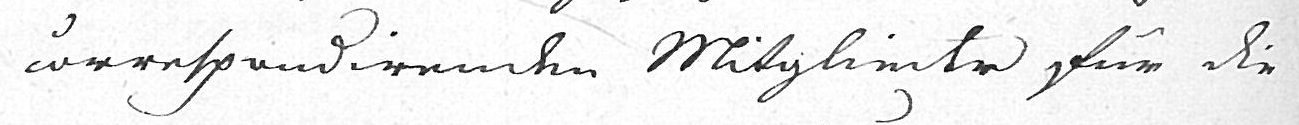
correspondirenden Mitglieder für die
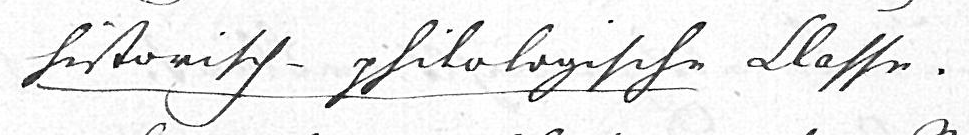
historisch-philologische Classe.
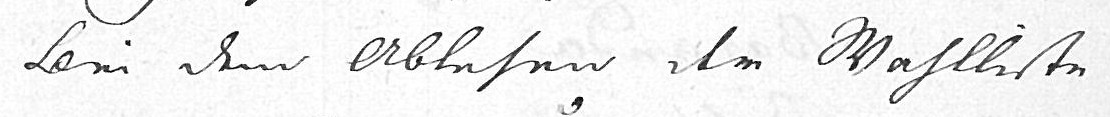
Bei dem Ablesen der Wahlliste
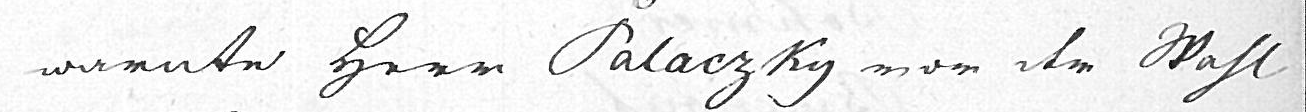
warnte Herr Palaczky vor der Wahl
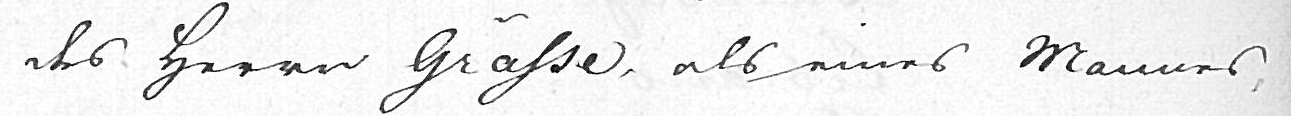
des Herrn Grässe, als eines Mannes,
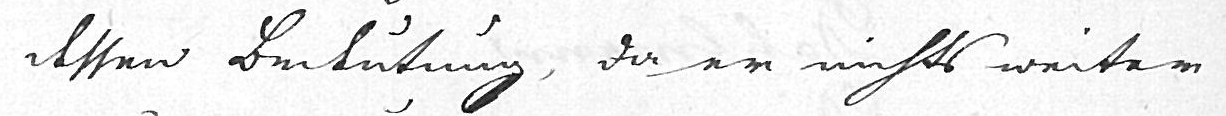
dessen Bedeutung, da er nichts weiter
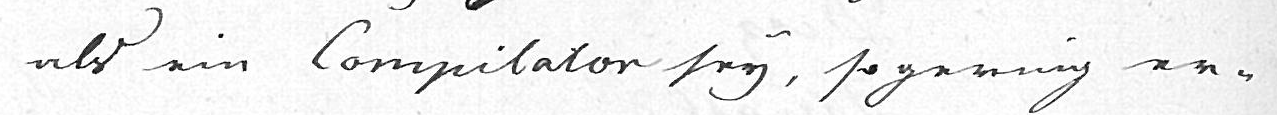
als ein Compilator sey, so gering er-
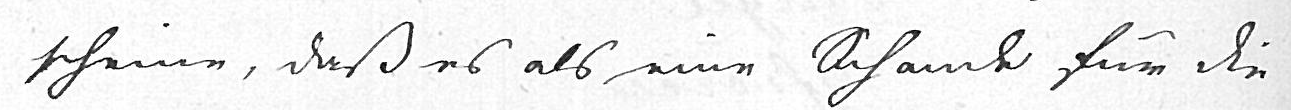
scheine, daß es als eine Schande für die
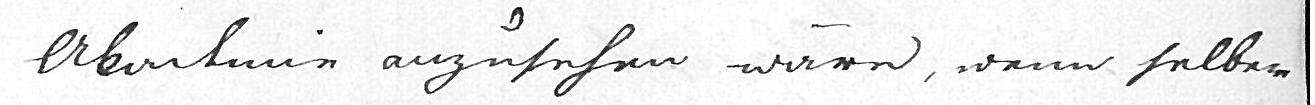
Akademie anzusehen wäre, wenn selber
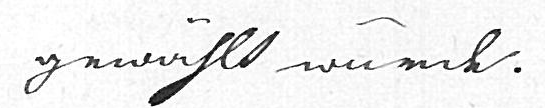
gewählt würde.
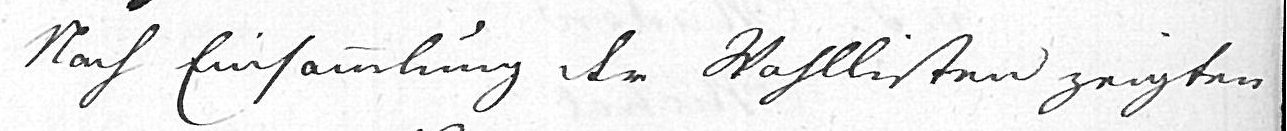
Nach Einsammlung der Wahllisten zeigten
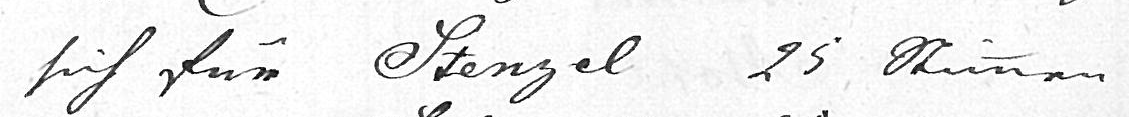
sich für Stenzel 25 Stimmen
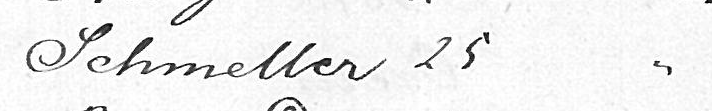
Schmeller 25 "
